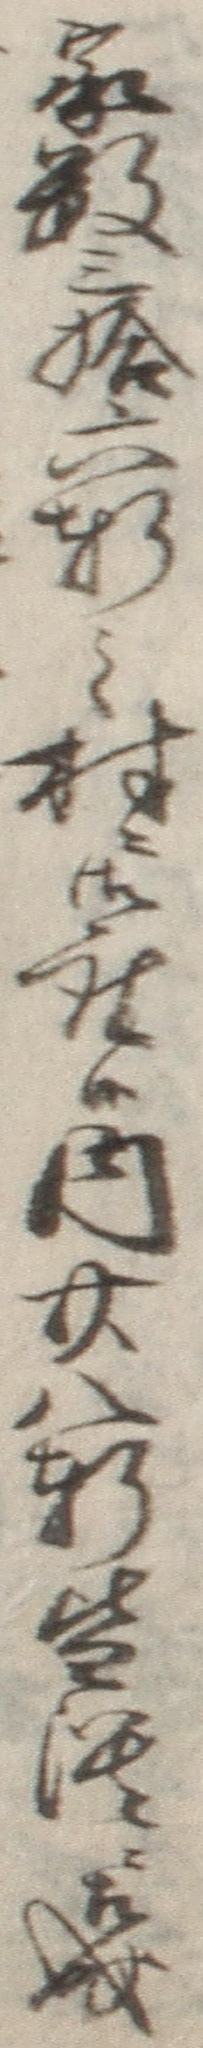家数三拾六軒之村ニ御座候内廿八軒皆潰ニ相成
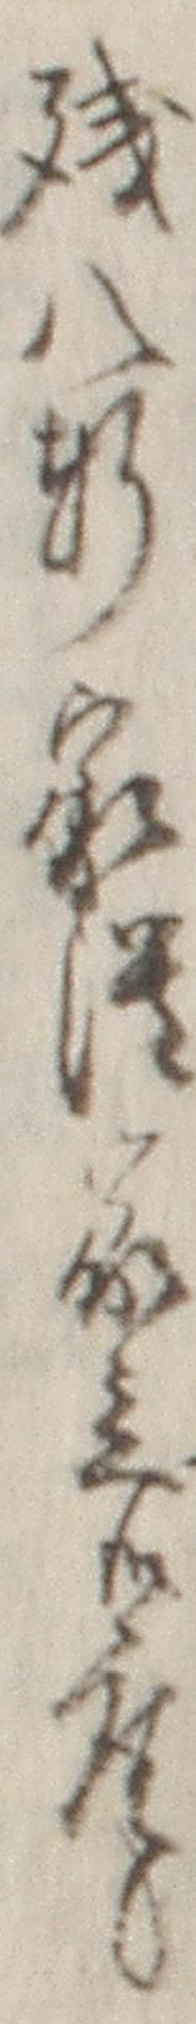残八軒半潰家立御座候

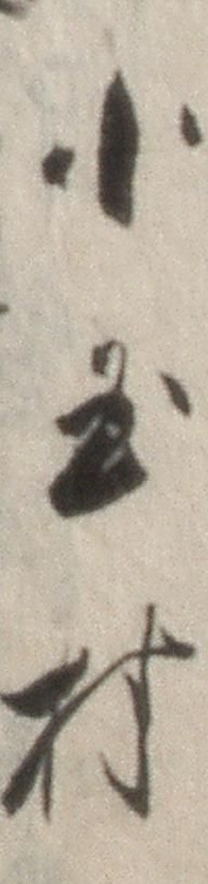小玉村
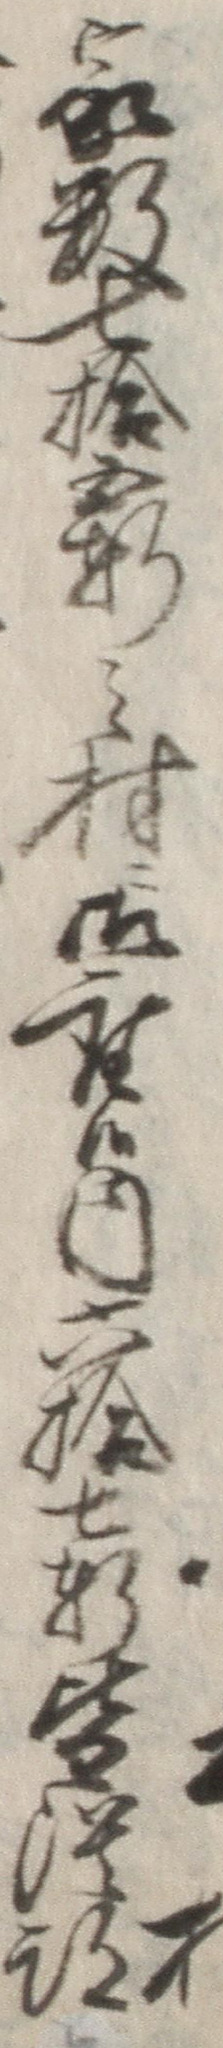家数七拾五軒之村ニ御座候内六拾七軒皆潰跡
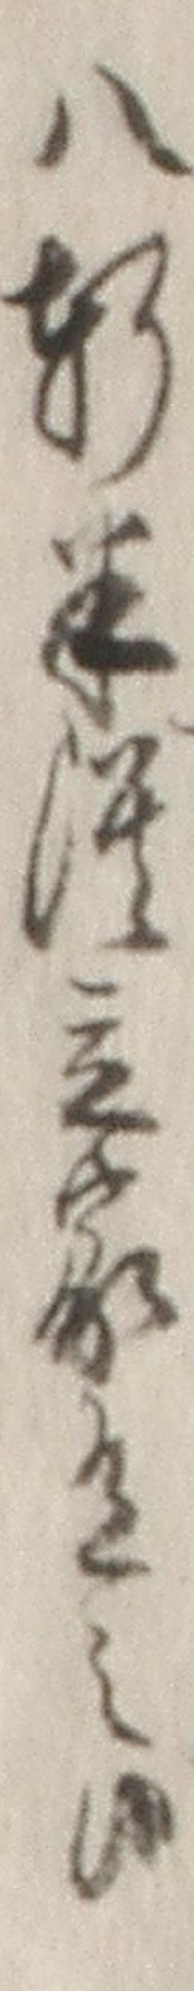八軒半潰立家有之候
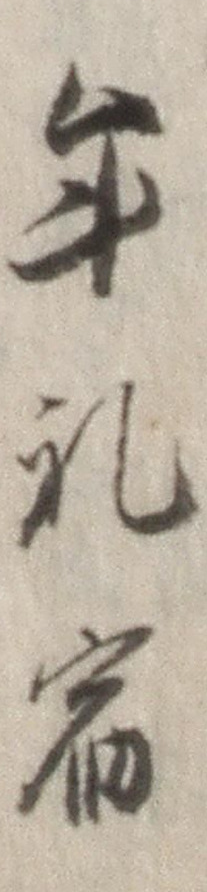牟礼宿
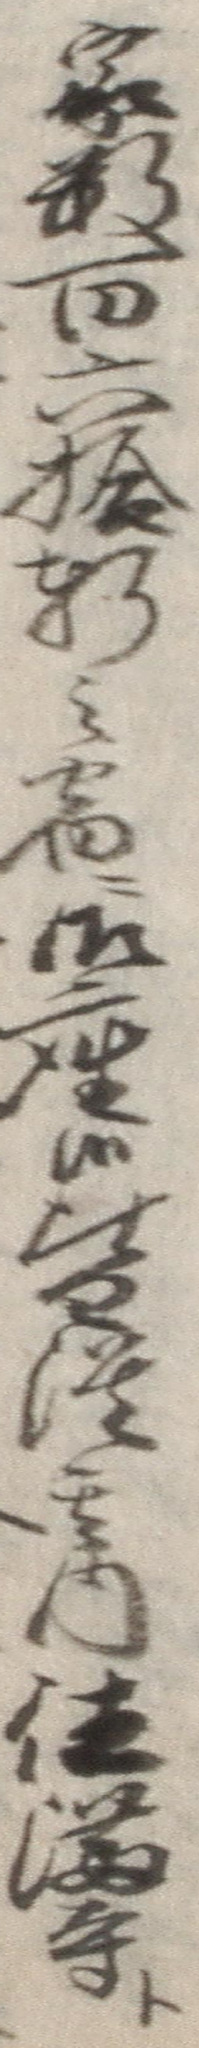家数百六拾軒之宿ニ御座候皆潰其内徳満寺ト
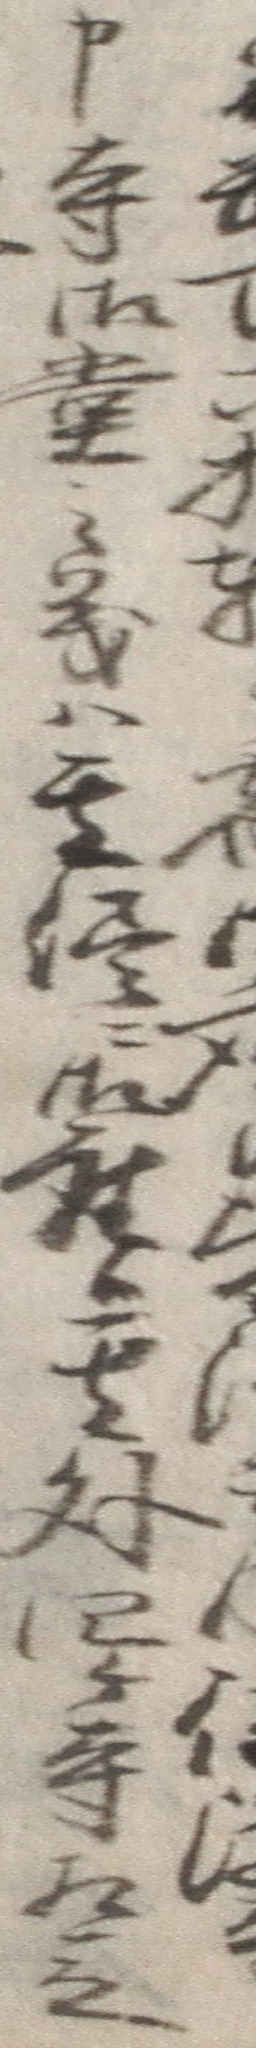申寺御堂之義ハ其儘ニ御座候其外四ヶ寺相立
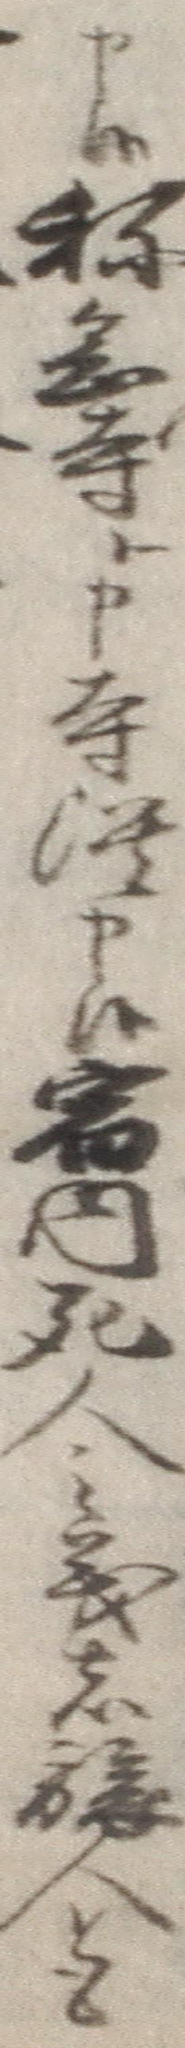申候称念寺ト申寺潰申候宿内死人之義は旅人とも
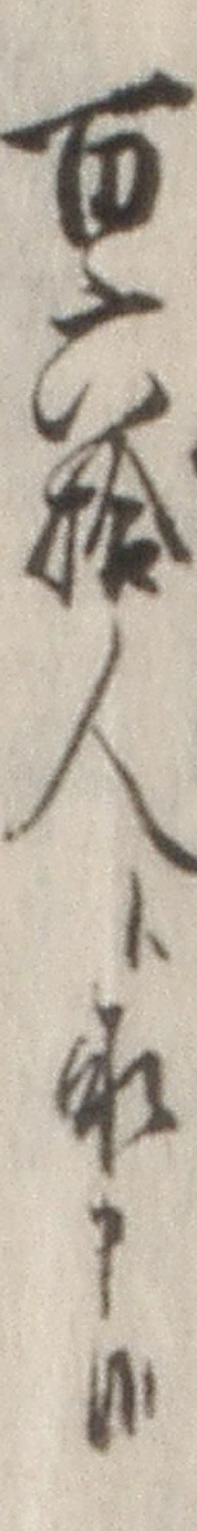百六拾人ト承申候
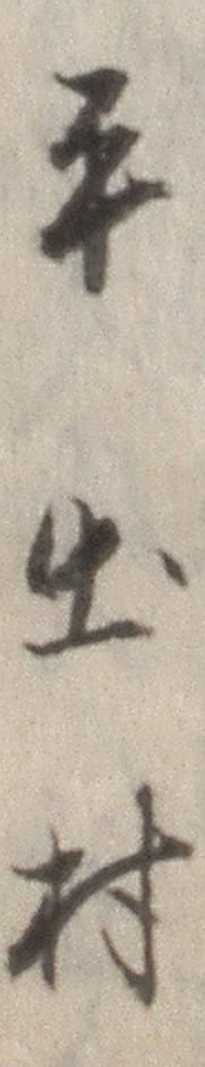平出村
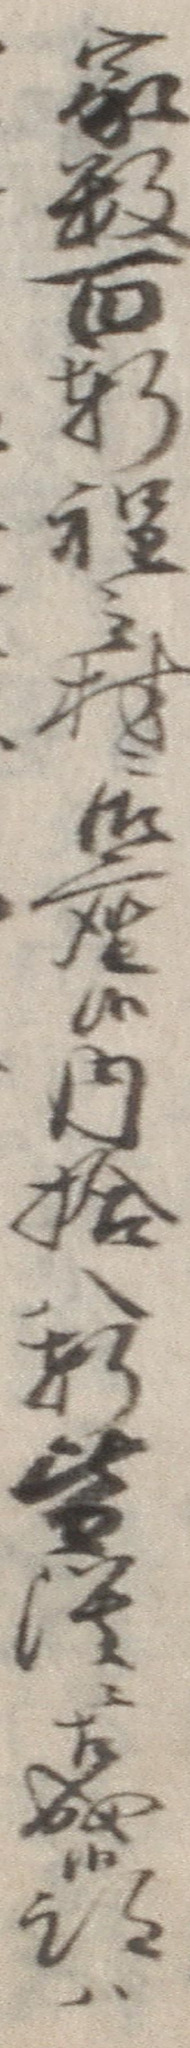家数百軒程之村ニ御座候内拾八軒皆潰ニ相成候跡ハ
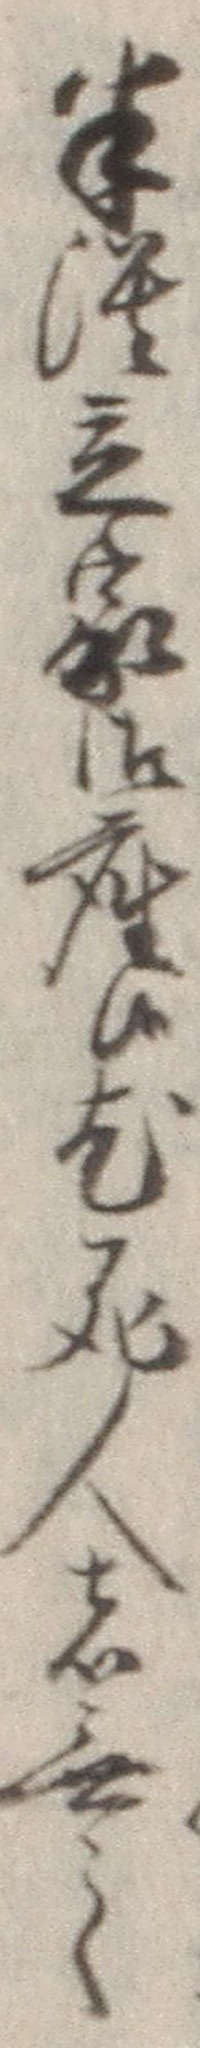半潰立家御座候尤死人者無之候
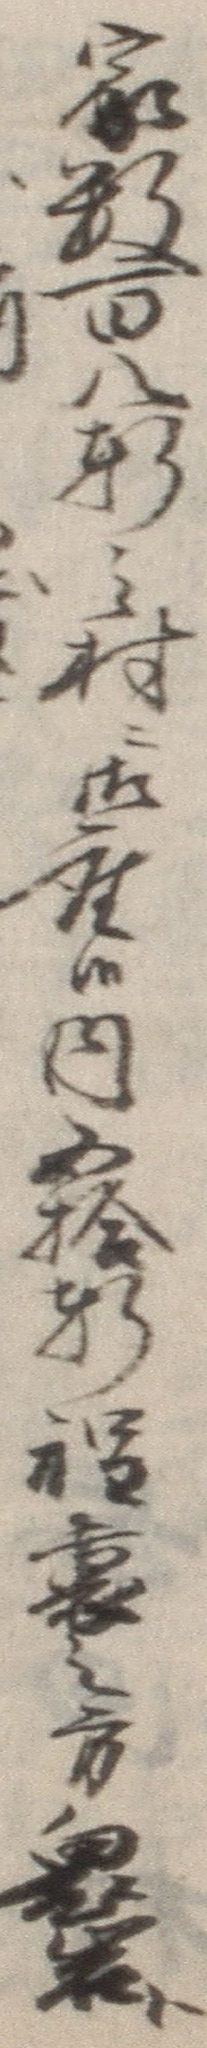家数百八軒之村ニ御座候内五拾軒程裏之方鬼岩ト
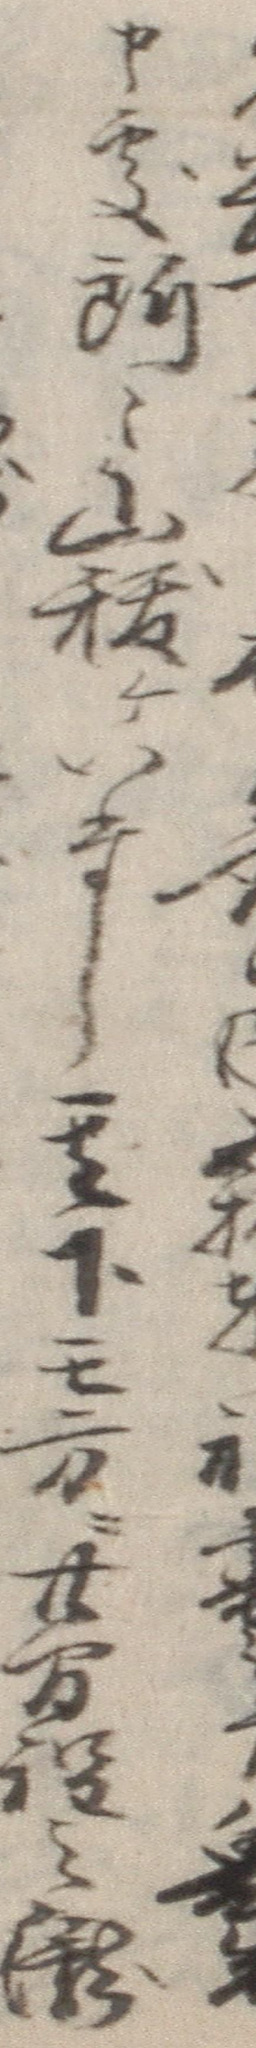申處所々山抜ヶいたし其下モ方ニ廿間程之瀧
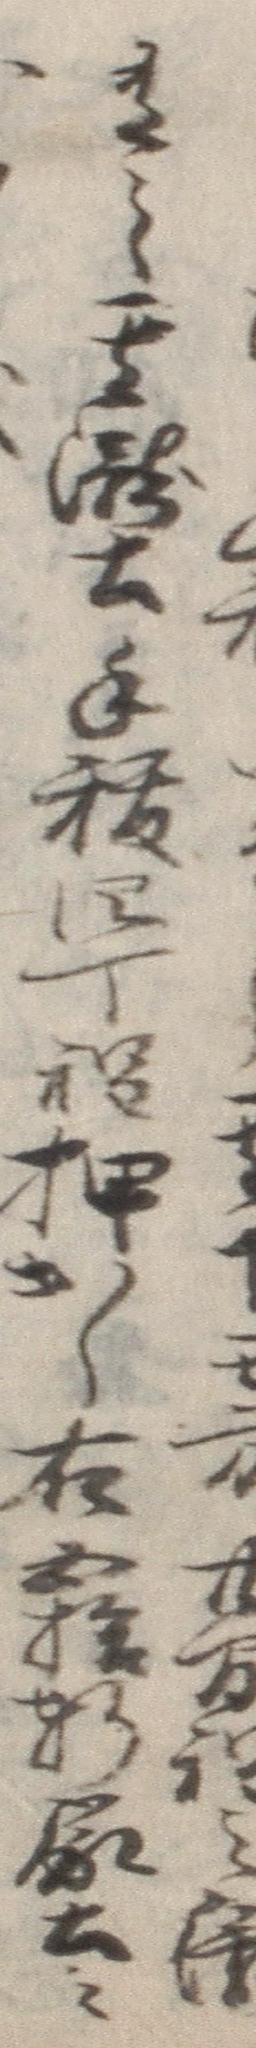有之候其瀧土手抜四丁程押出し右五拾軒崩土之
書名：[善光寺地震に関する冊子]
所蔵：東京大学地震研究所図書室 Earthquake Research Institute Library, The University of Tokyo, JAPAN
